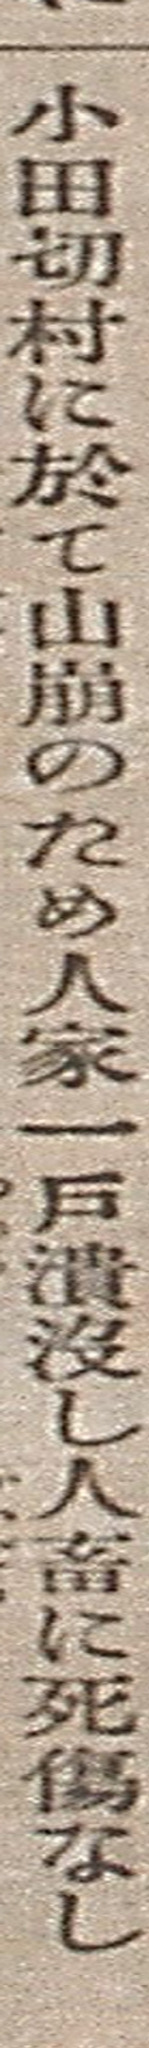小田切村に於て山崩のため人家一戸潰没し人畜に死傷なし
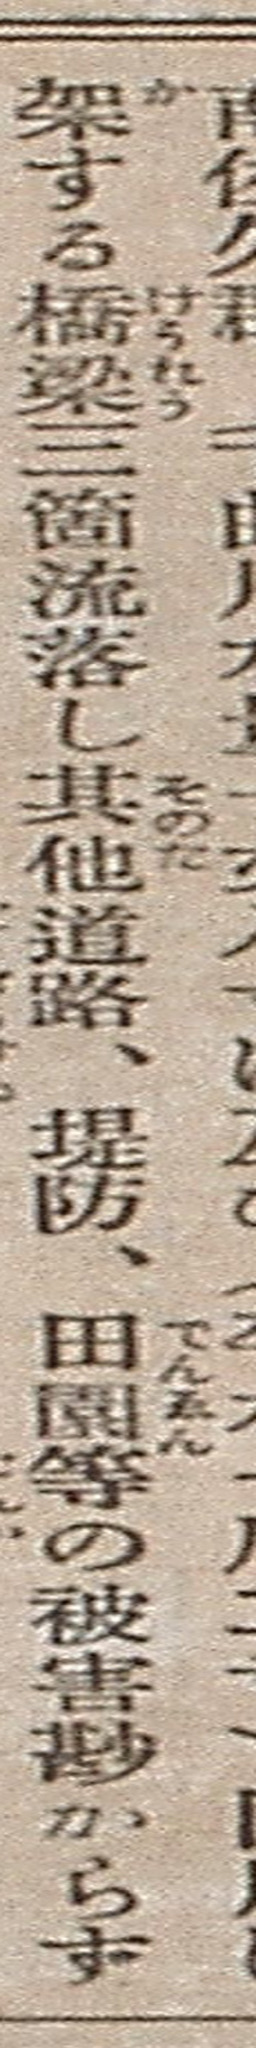架する橋梁三箇流落し其他道路、堤防、田園等の被害尠からず
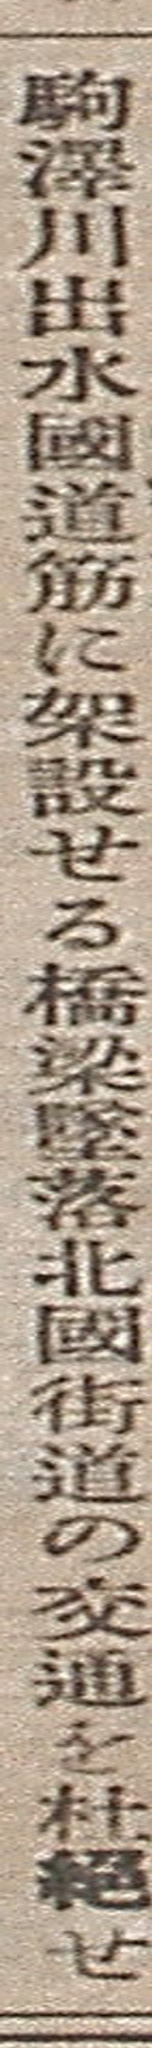駒沢川出水国道筋に架設せる橋梁墜落北国街道の交通を杜絶せ
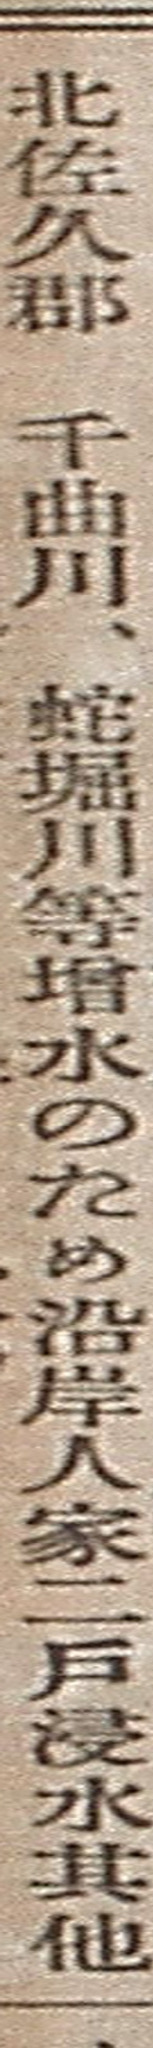北佐久郡千曲川、蛇堀川等増水のため沿岸人家二戸浸水其他
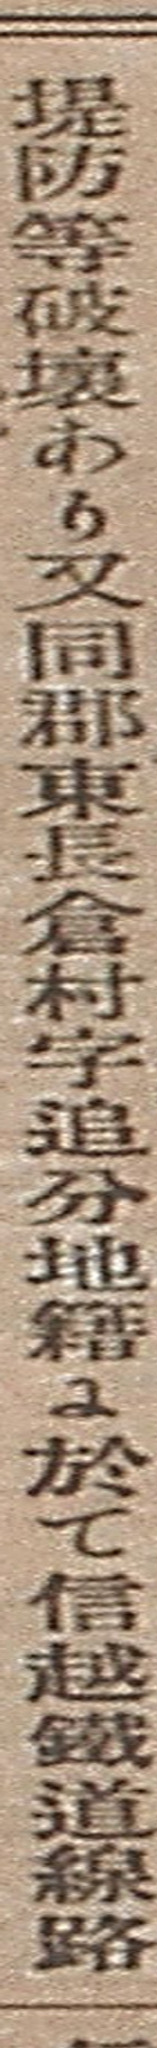堤防等破壊あり又同郡東長倉村字追分地籍に於て信越鉄道線路
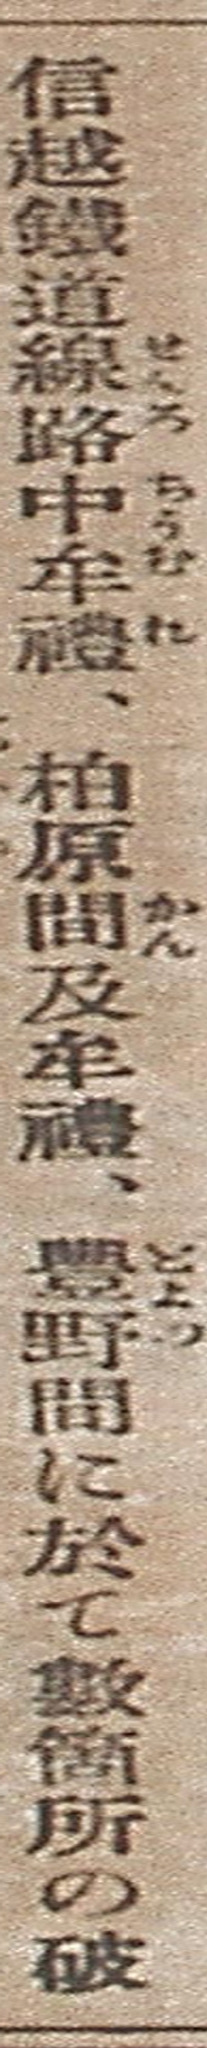信越鉄道線路中牟礼、柏原間及牟礼、豊野間に於て数箇所の破
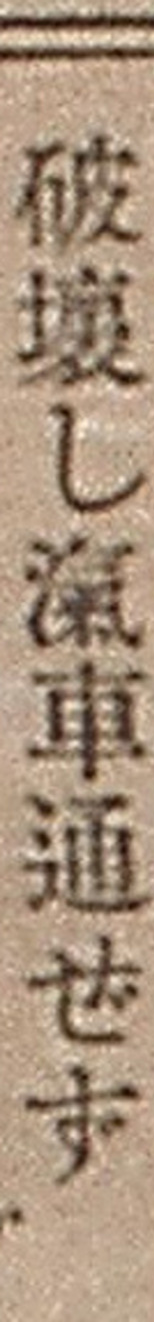破壊し汽車通ぜず
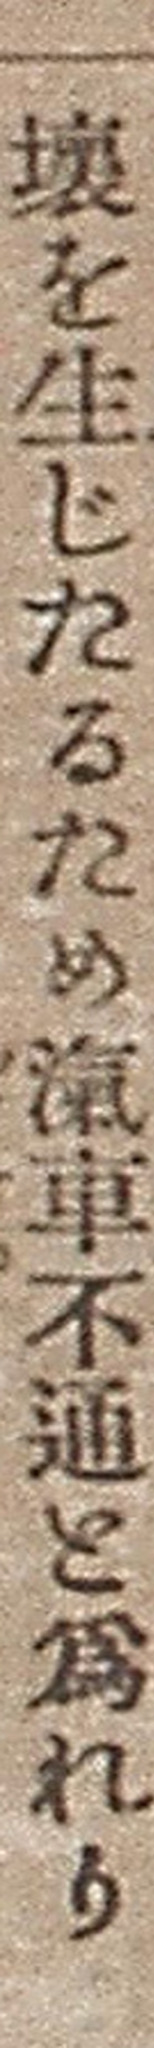壊を生じたるため汽車不通と為れり
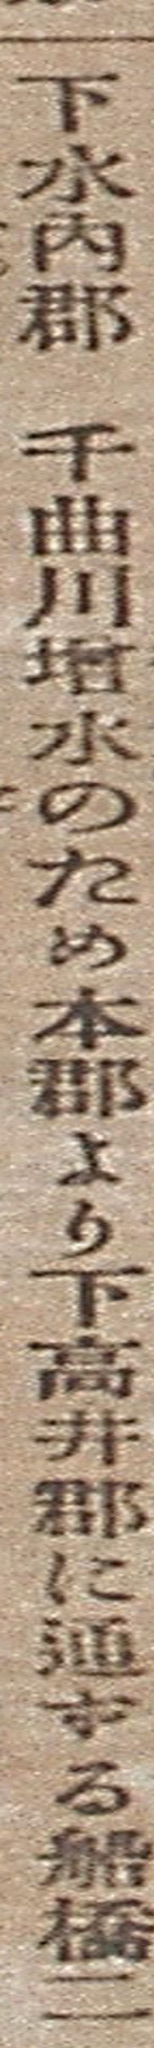下水内郡千曲川増水のため本部より下高井郡に通ずる船橋二
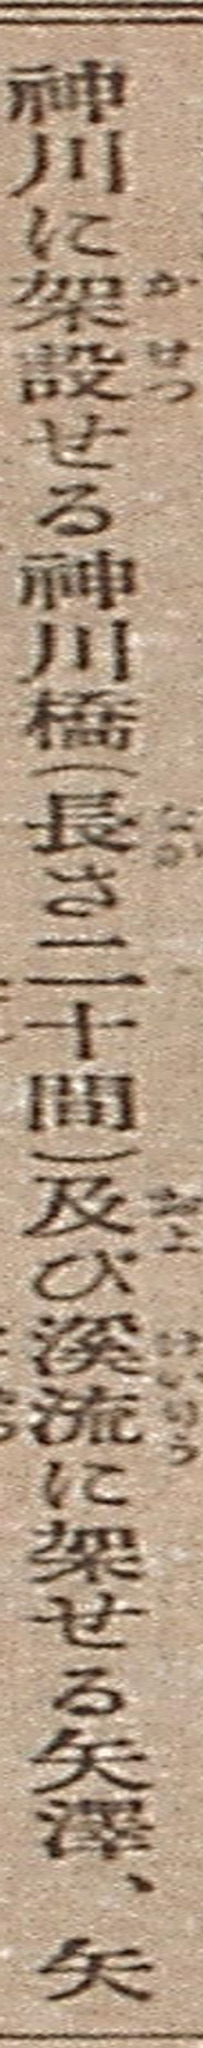神川に架設せる神川橋さ二十間）及び渓流に架せる矢沢、矢
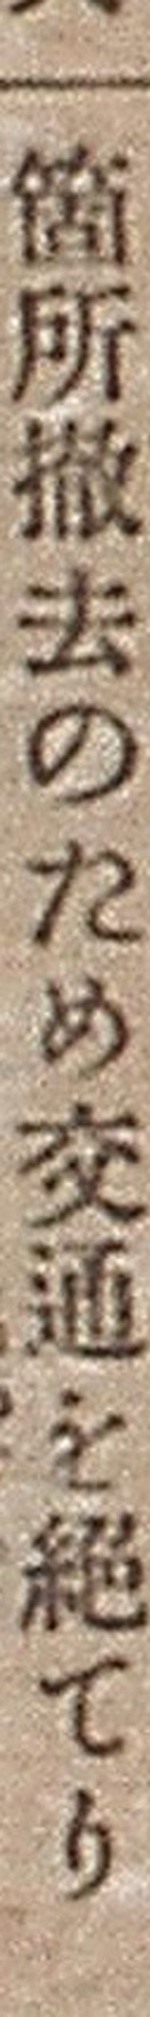箇所撤去のため交通を絶てり
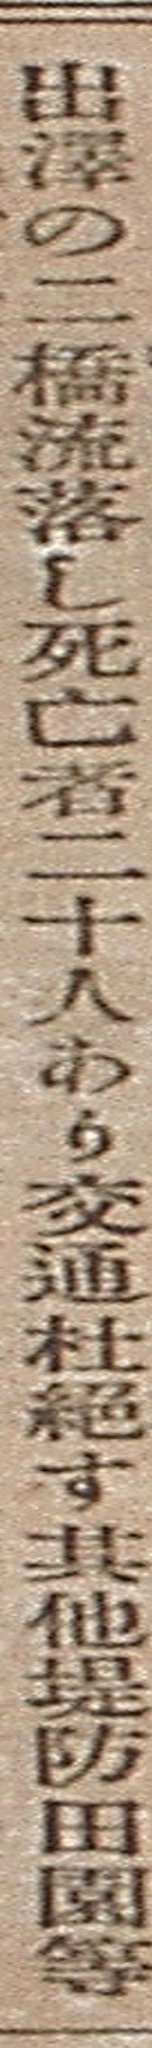出沢の二橋流落し死亡者二十人あり交通杜絶す其他堤防田園等
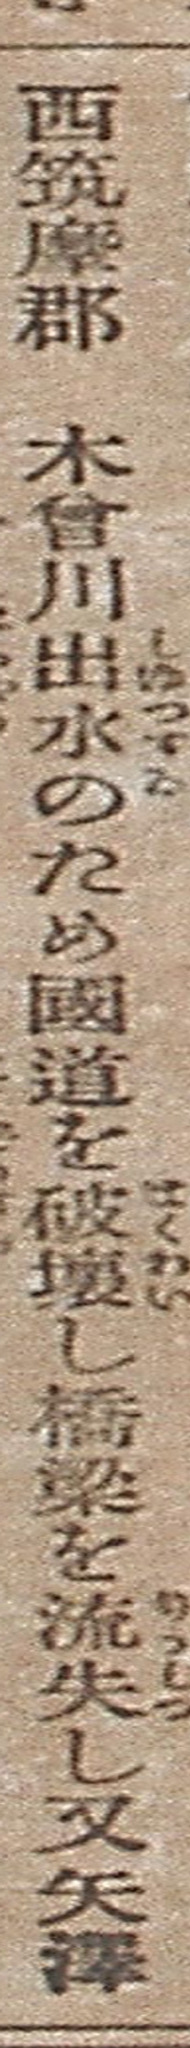西筑摩郡木曽川出水のため国道を破壊し橋梁を流失し又矢沢
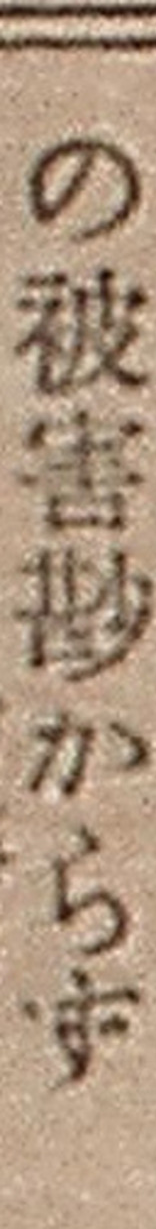の被害尠からず
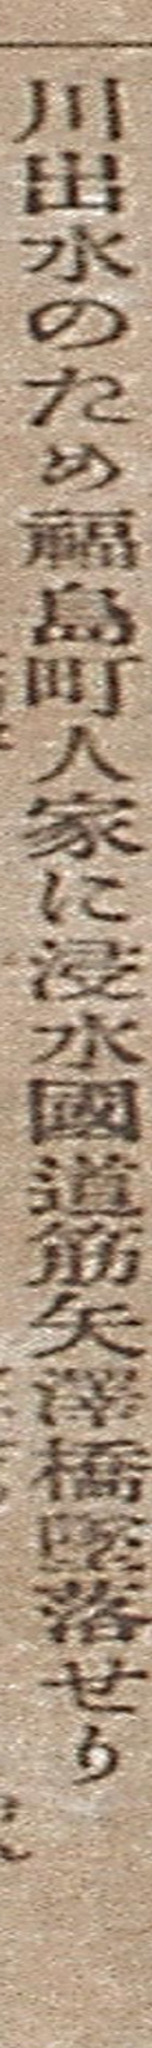川出水のため福島町人家に浸水国道筋矢沢橋墜落せり
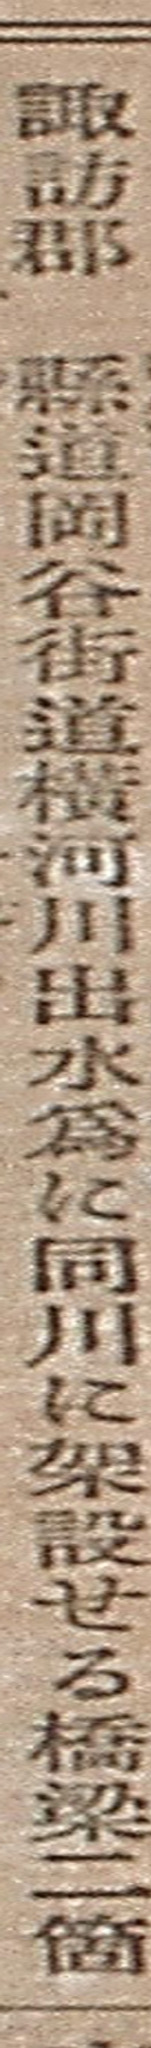諏訪郡県道岡谷街道横河川出水為に同川に架せる橋梁二箇
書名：風俗畫報臨時増刊第百二十六號　洪水被害録（中）
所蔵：東京大学地震研究所図書室 Earthquake Research Institute Library, The University of Tokyo, JAPAN
